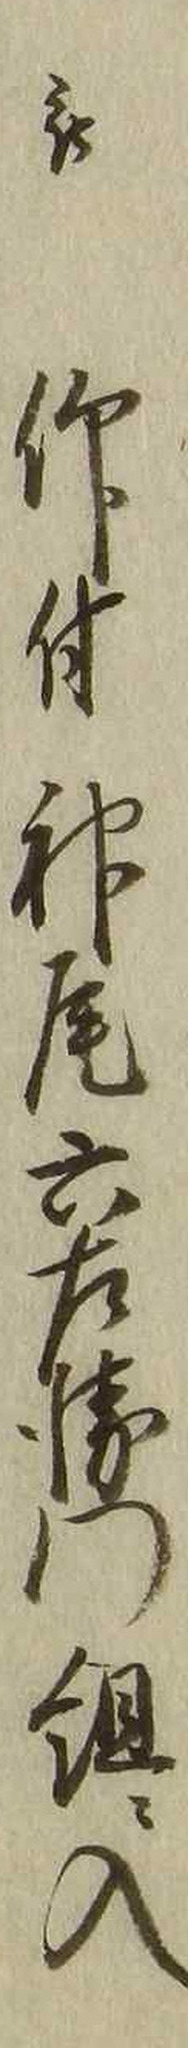被仰付神尾六左衛門組に入
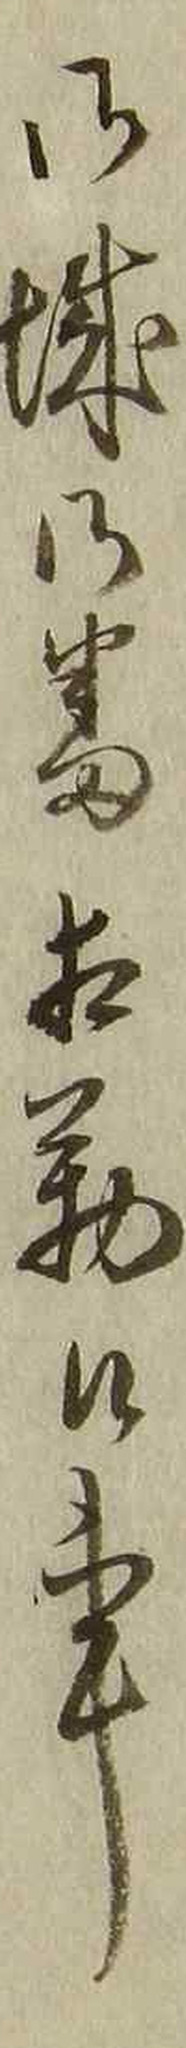御城御番相勤候事
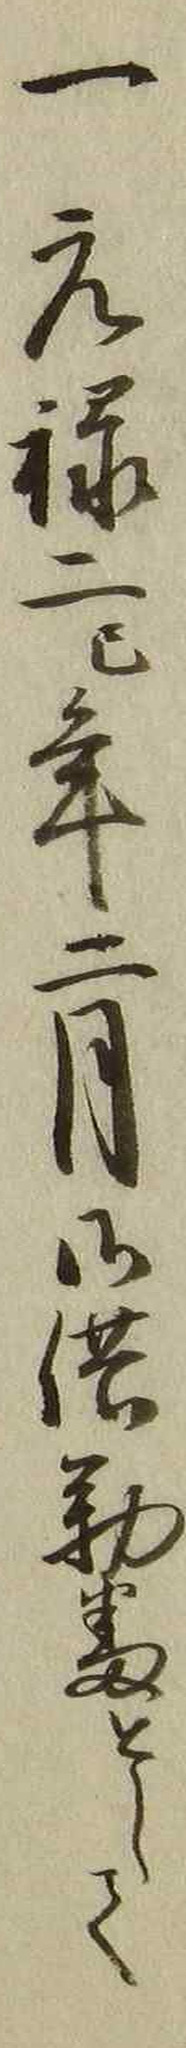一元禄二巳年二月御供勤番として
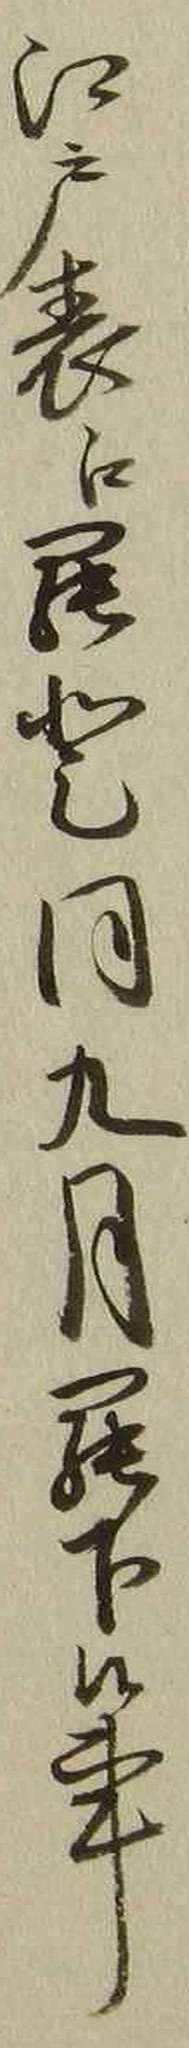江戸表江罷登同九月罷下候事
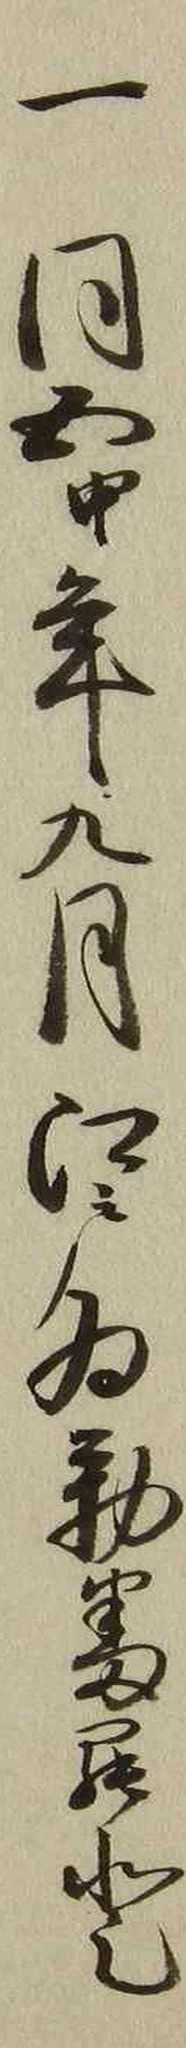一同五申年九月江戸為勤番罷登
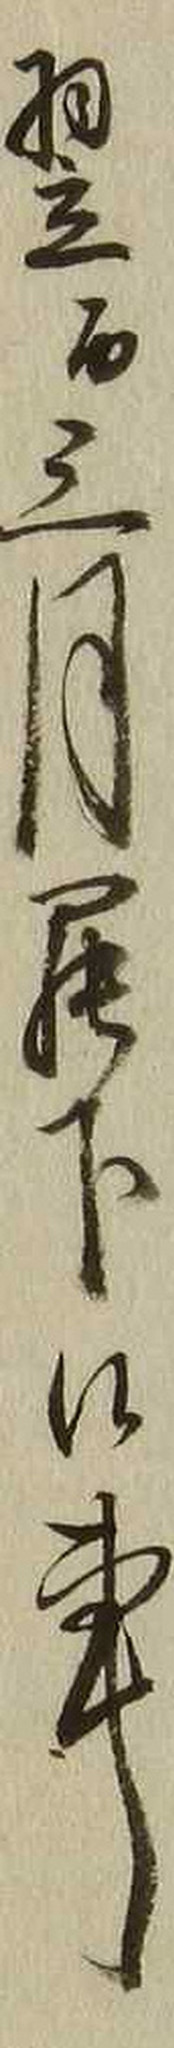翌酉三月罷下候事
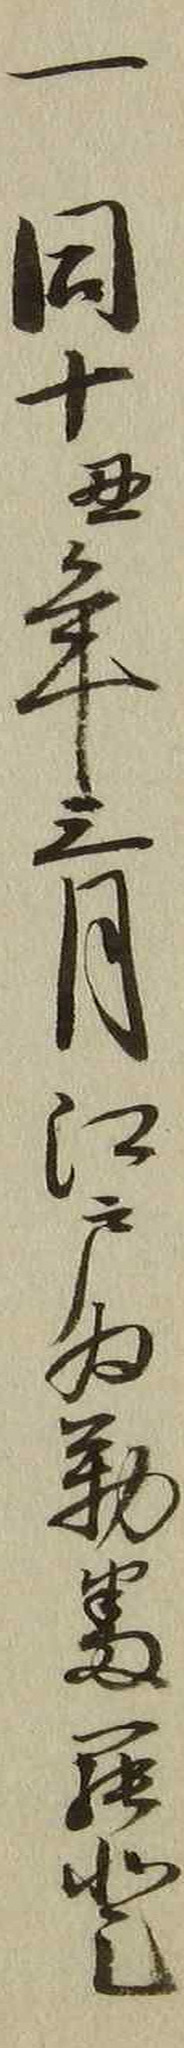一同十丑年三月江戸為勤番罷登
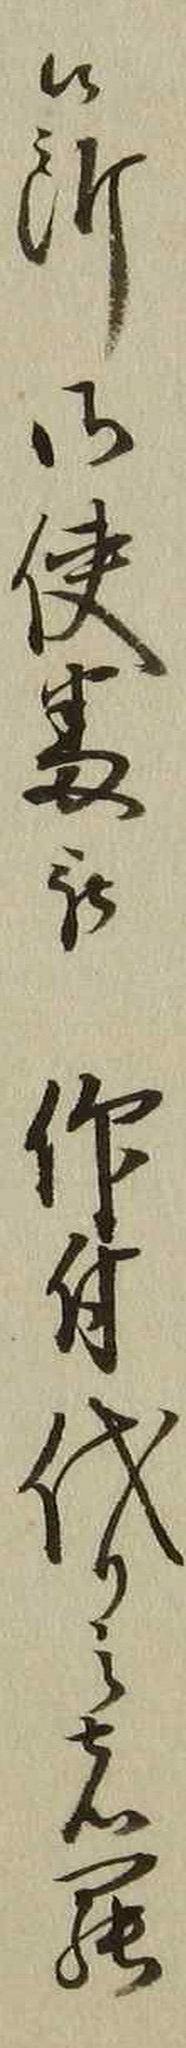候所御使番被仰付代り之者罷
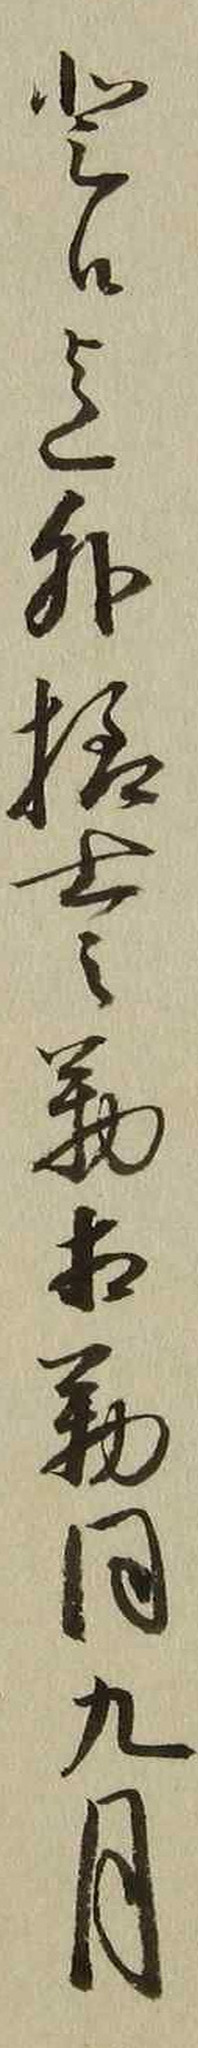登候迄外様士之勤相勤同九月
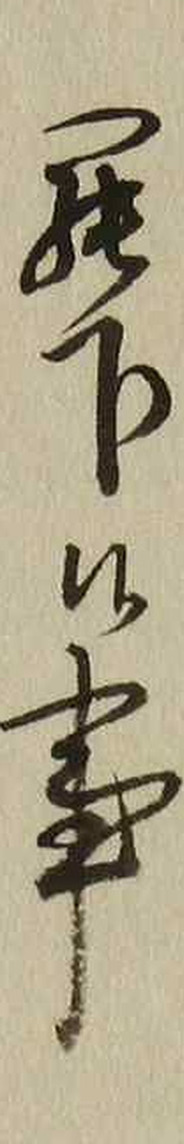罷下候事
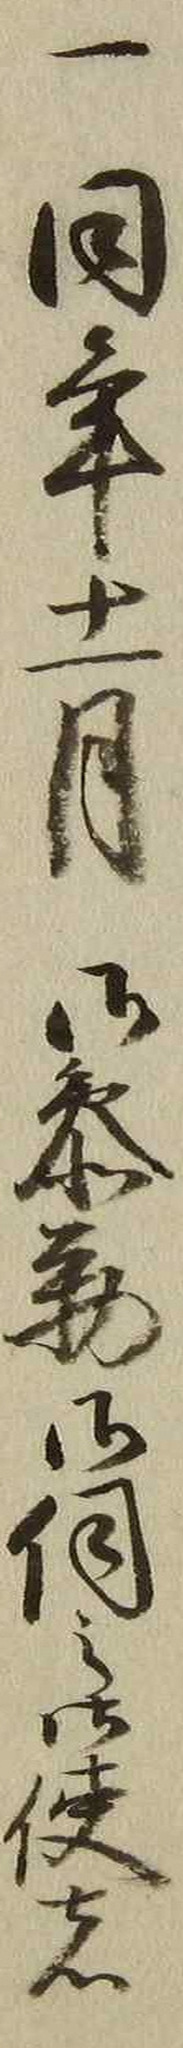一同年十一月御参勤御伺之御使者
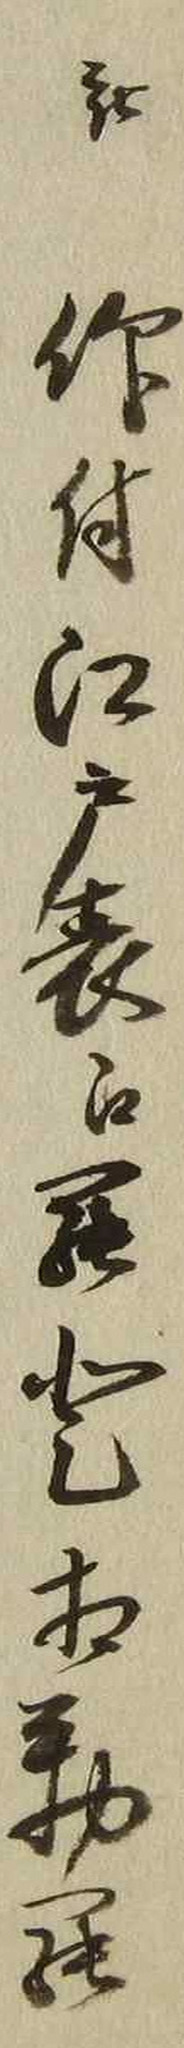被仰付江戸表江罷登相勤罷
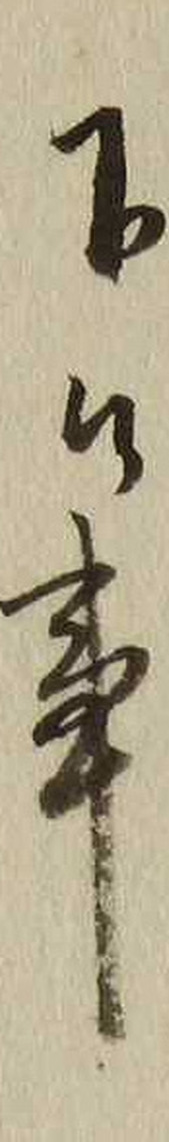下候事
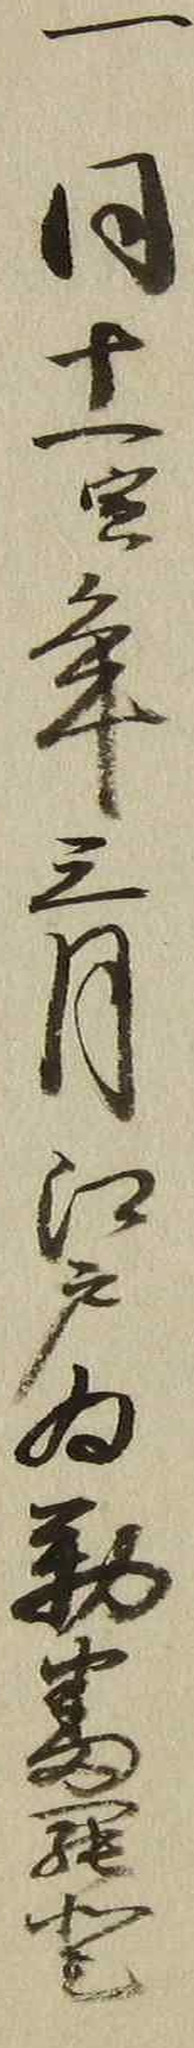一同十一寅年三月江戸為勤番罷登
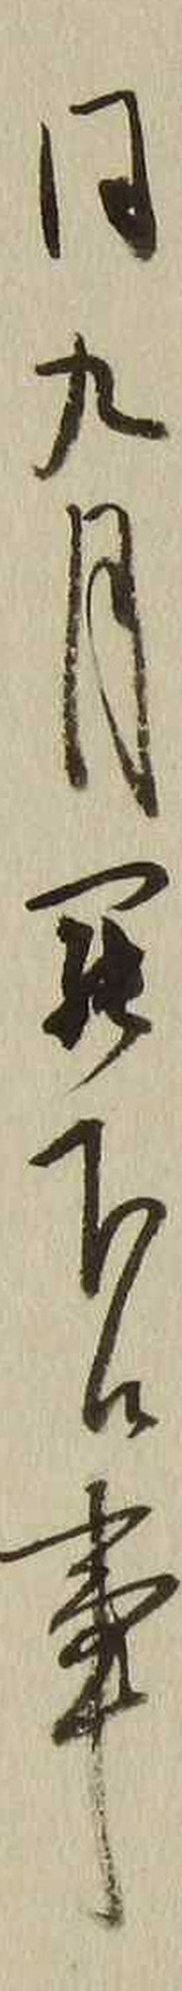同九月罷下候事
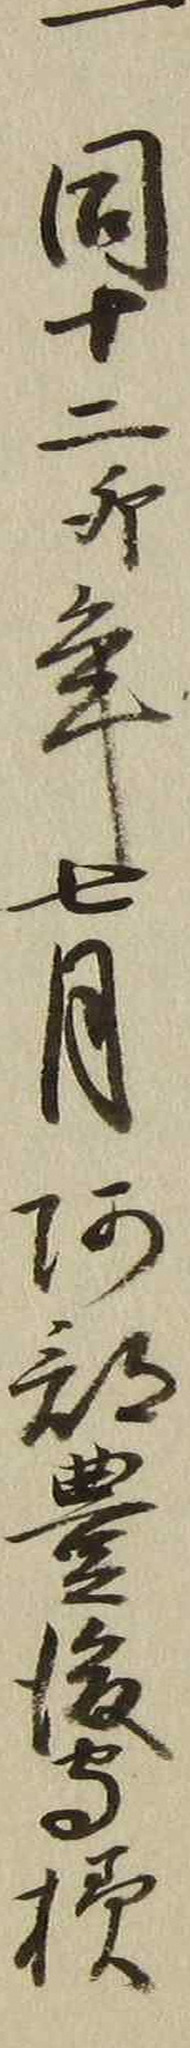一同十二卯年七月阿部豊後守様
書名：諸士系譜　巻之133　た之部9
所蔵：会津若松市立会津図書館
